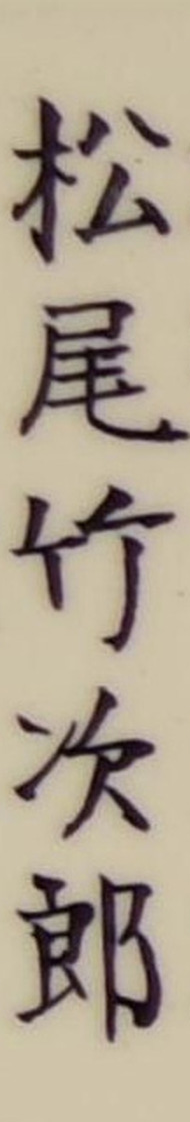松尾竹次郎
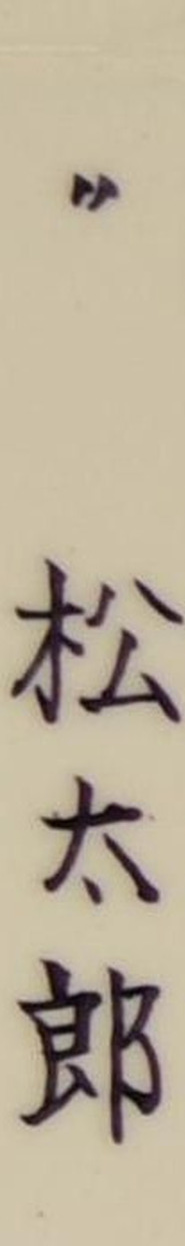松太郎
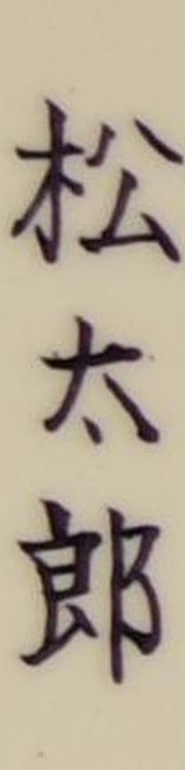松太郎

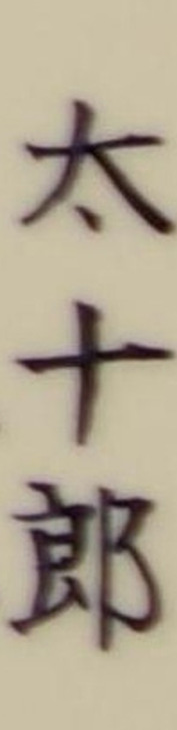太十郎
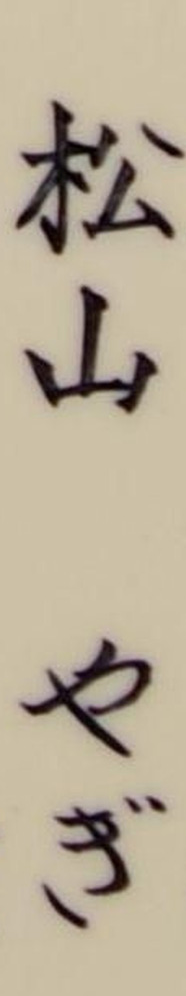松山やぎ
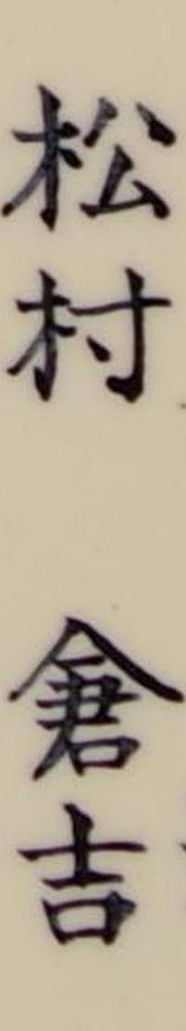松村倉吉
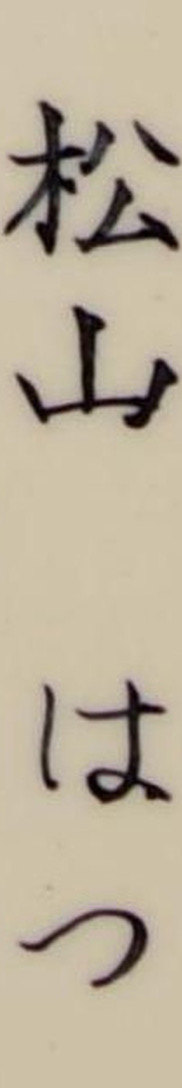松山はつ
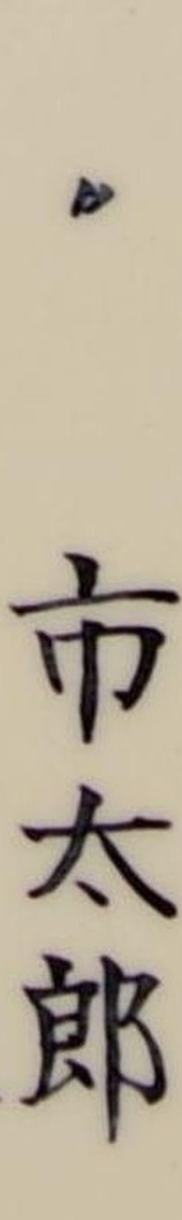市太郎
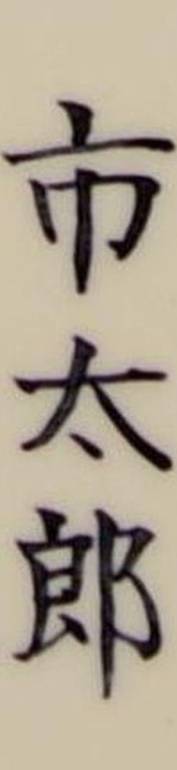市太郎
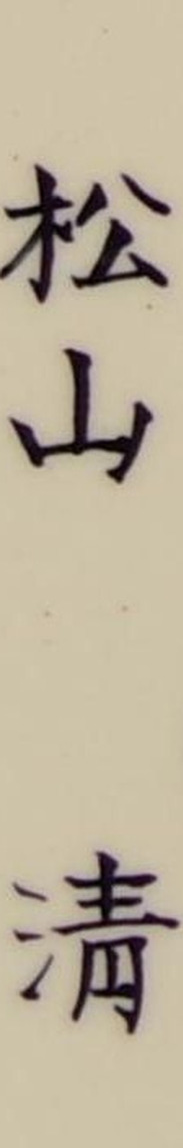松山清

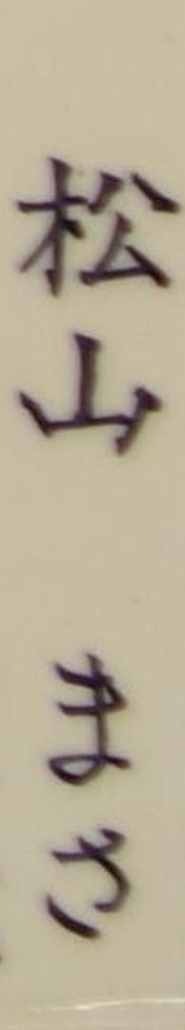松山まさ
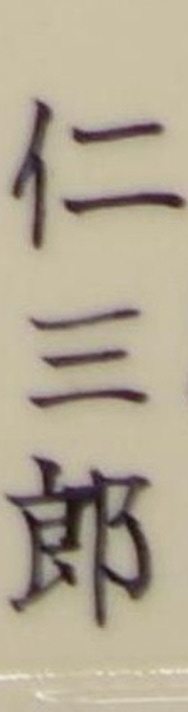仁三郎
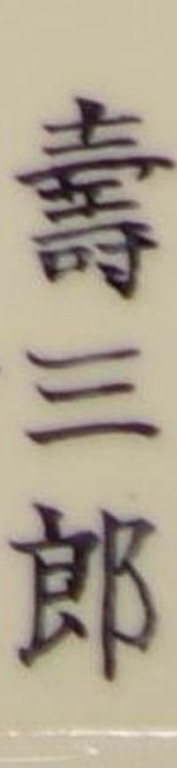仁三郎
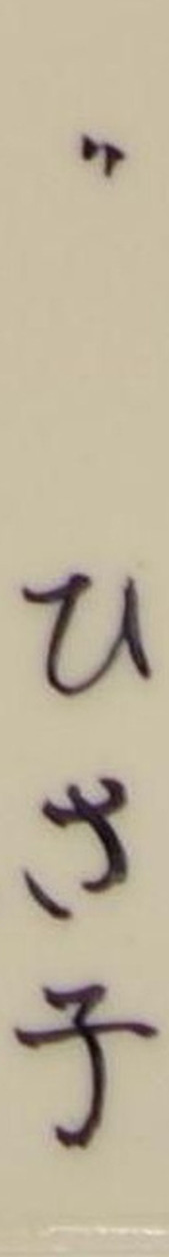ひさ子
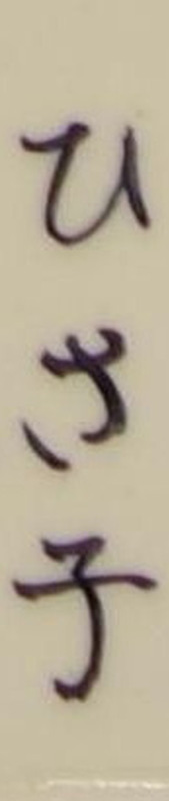ひさ子
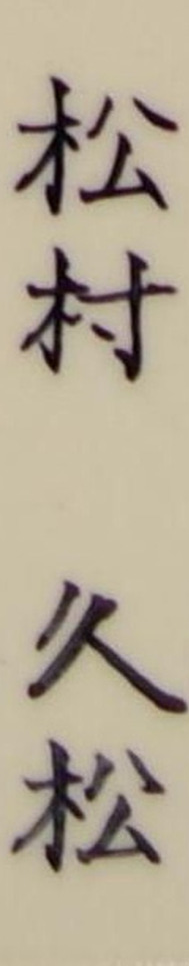松村久松
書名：A~D
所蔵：koyasan kongobuji
